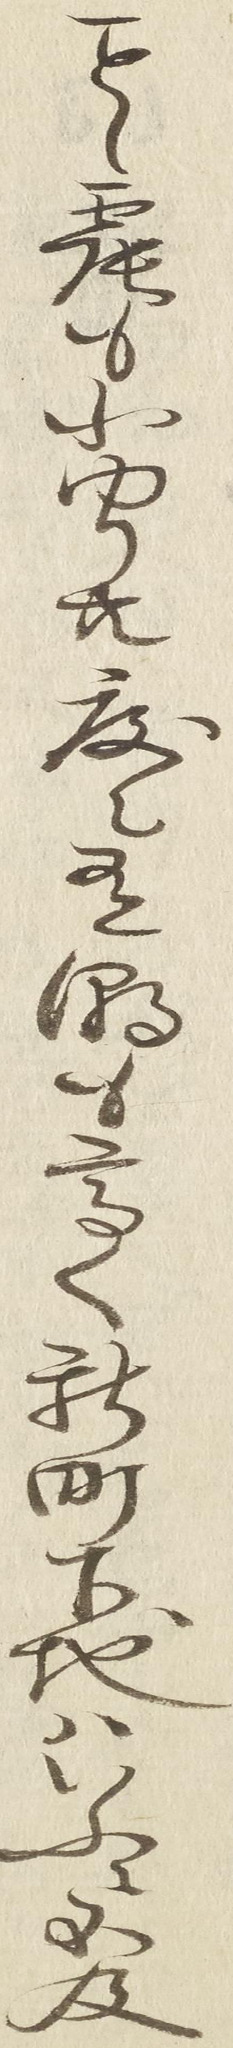ことし震も小ゆり共度々有潮も高く新町下地はいふに不及
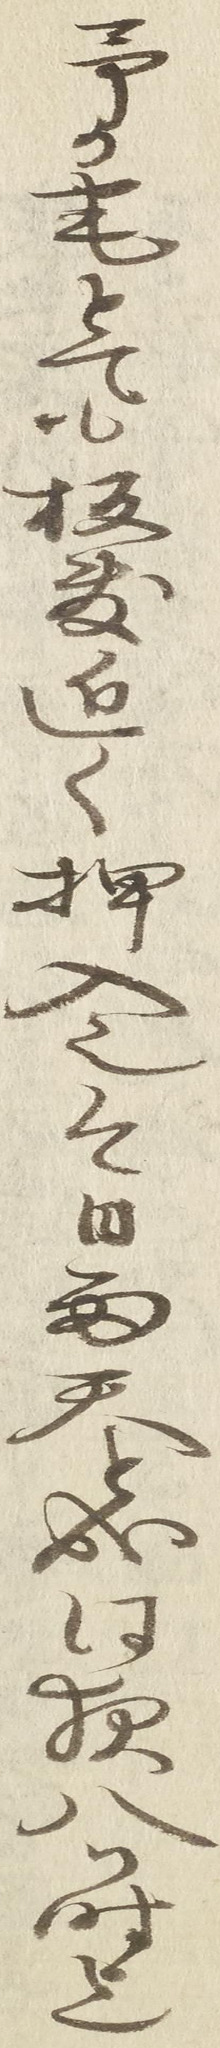予か宅とても板敷近く押入也今日雨天と成同夜八ッ時迄
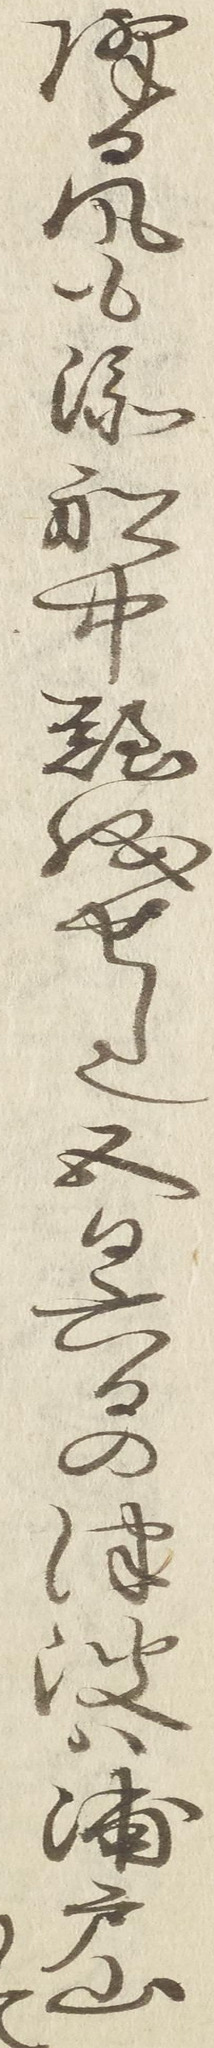降る風も添船中難儀せし也五日六日の津波は浦戸山にて
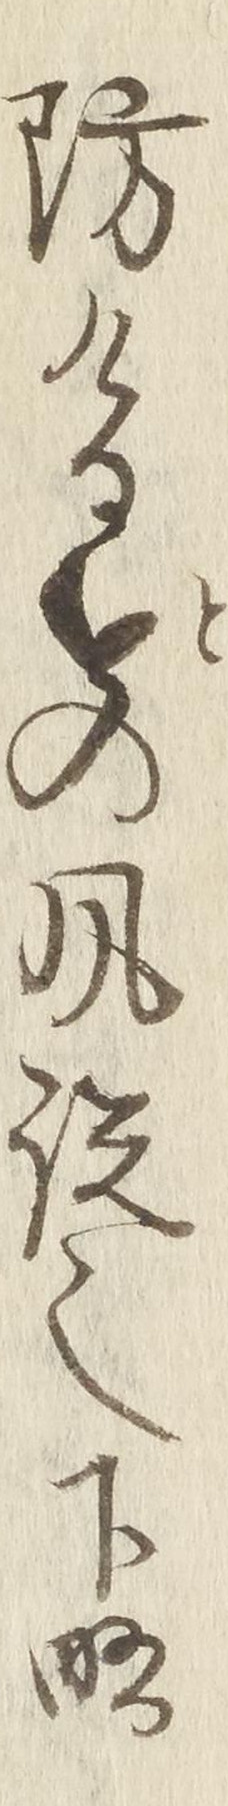防げるとの風説也下略
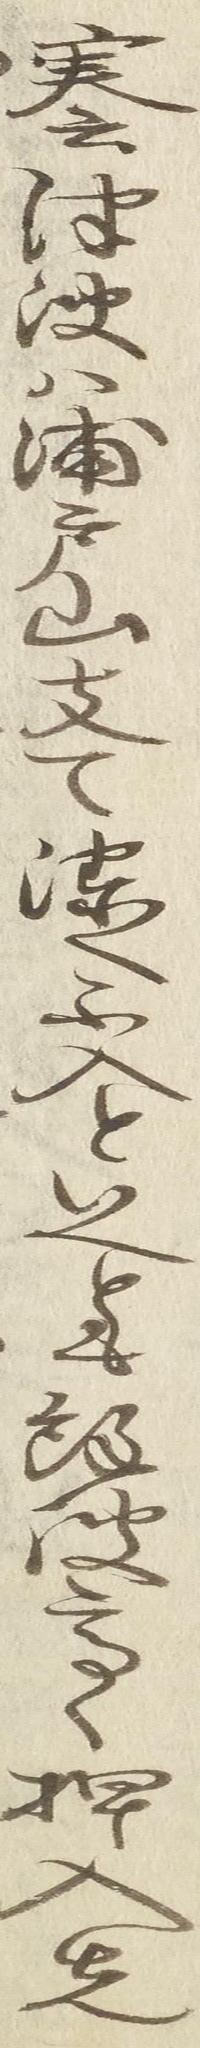実云津波は浦戸山支て深く不入といへとも余波高く押入先
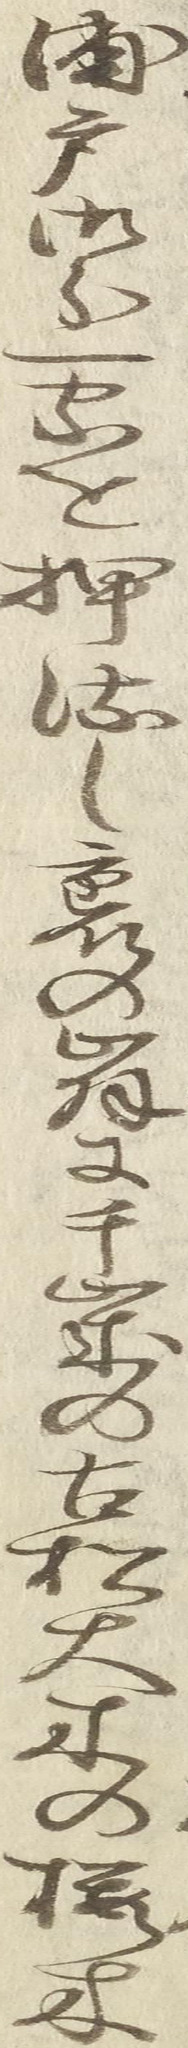浦戸御分一家を押流し裏の岸に千歳の古松大木の桜木
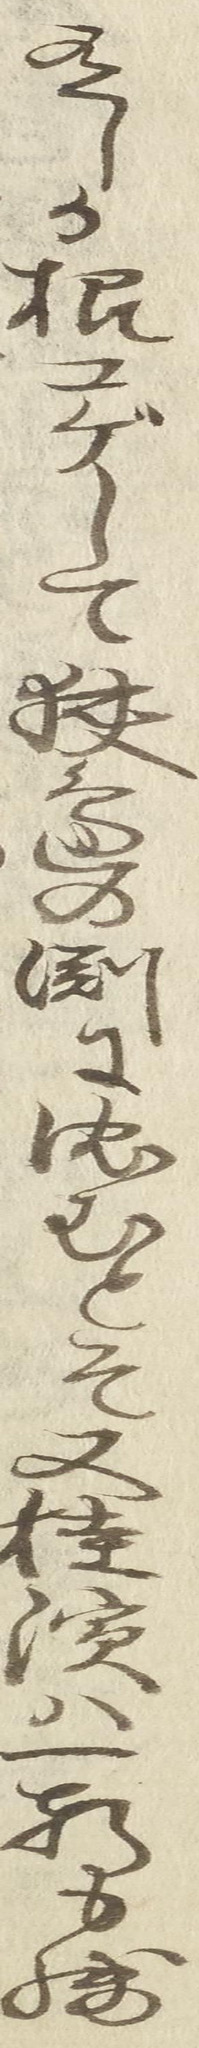有しか根コゲして狭島の渕に沈むとそ又桂浜は一軒も残
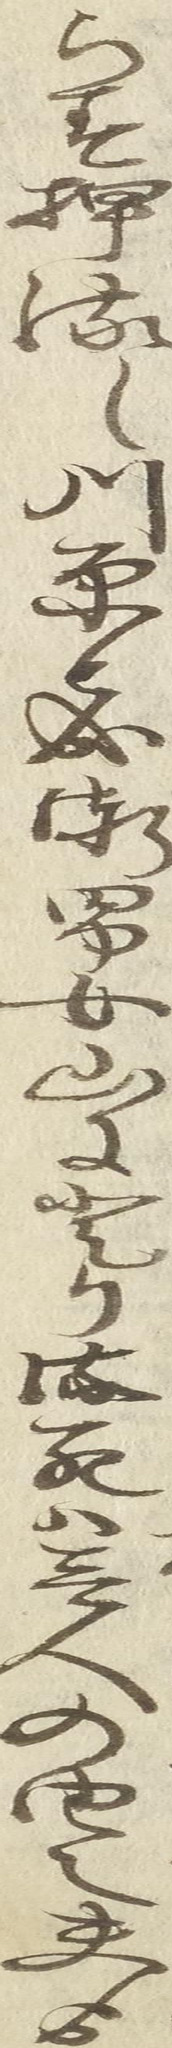らす押流し川原と成漸男女山に登り流死は壱人の由也夫より
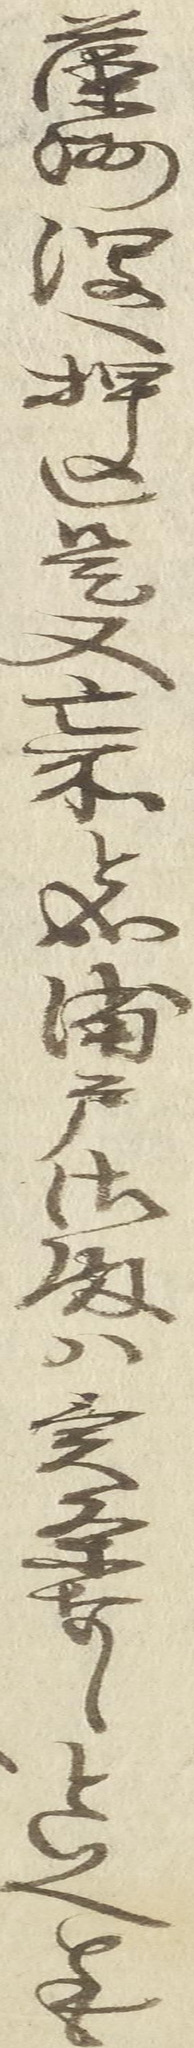藻洲瀉へ押込是又亡所と成浦戸御殿は異条なしといへとも
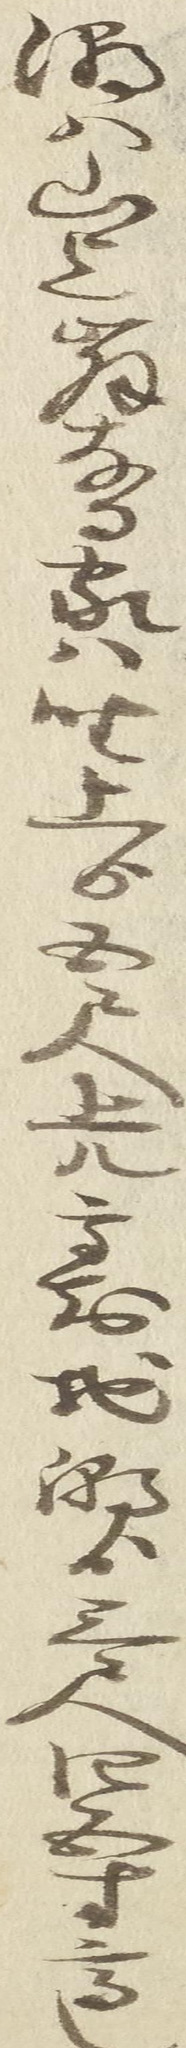潮は山迄岸なる家は座上より五尺上る高前地潮より三尺四五寸高し

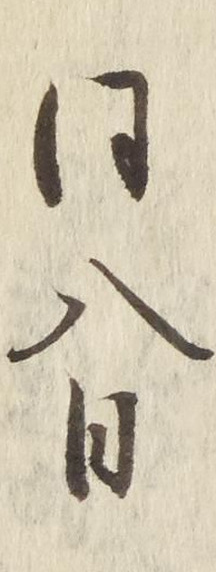同八日
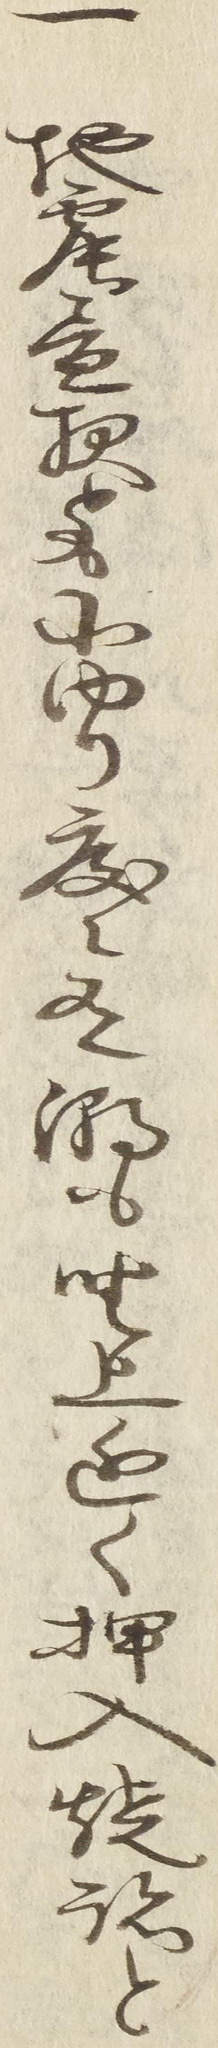一地震昼夜とも小ゆり度々有潮も座上近く押入焼跡と
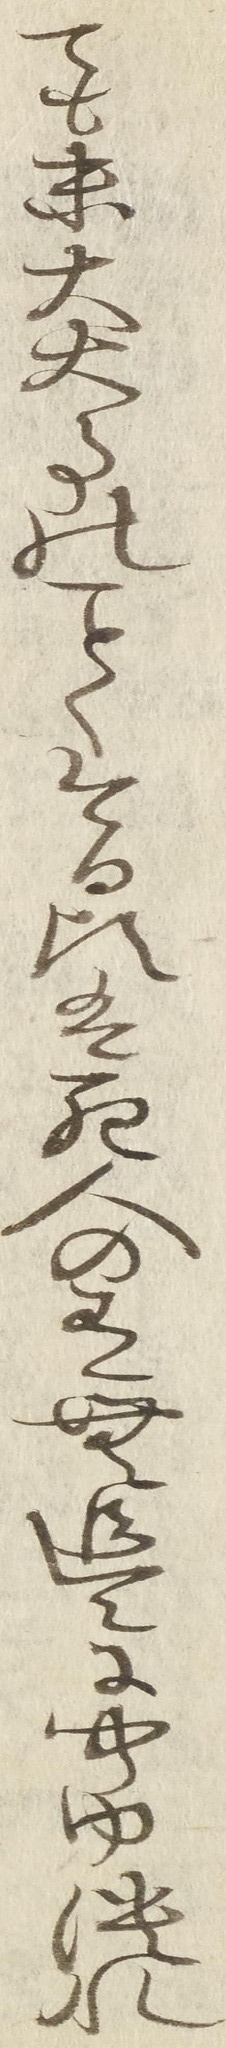ても未大火事のことく今日頃は死人の有無追々に聞ゆ潰れ
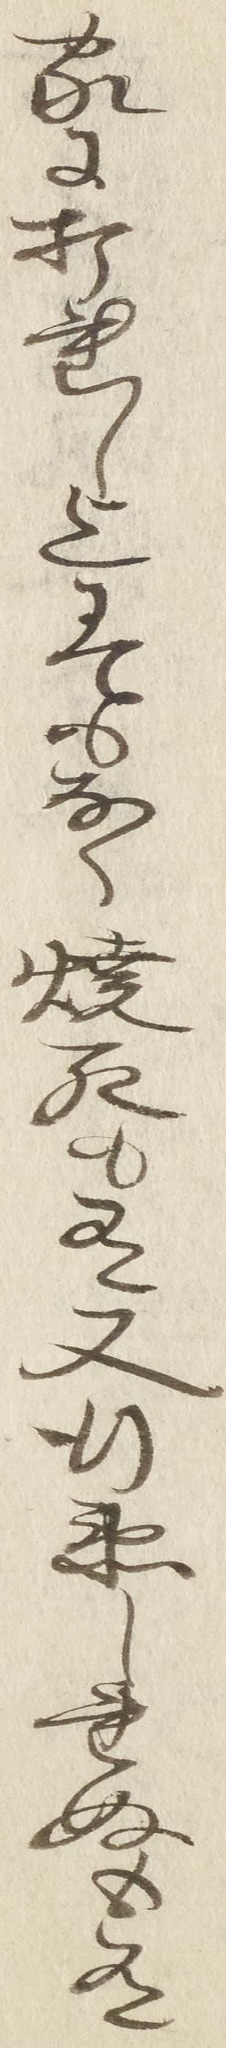家に打れし迄にてもなく焼死も有又行衛しれぬも有
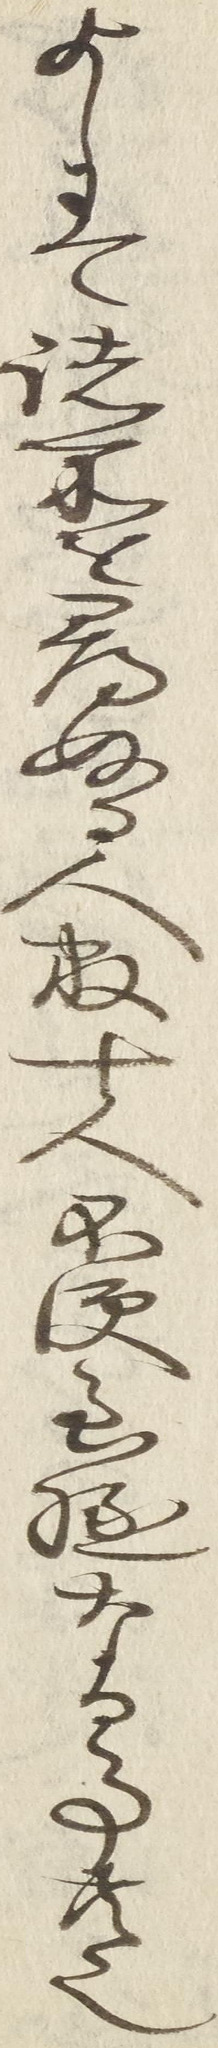よしにて諸所を尋ぬる人数十人不便至極なる事共也
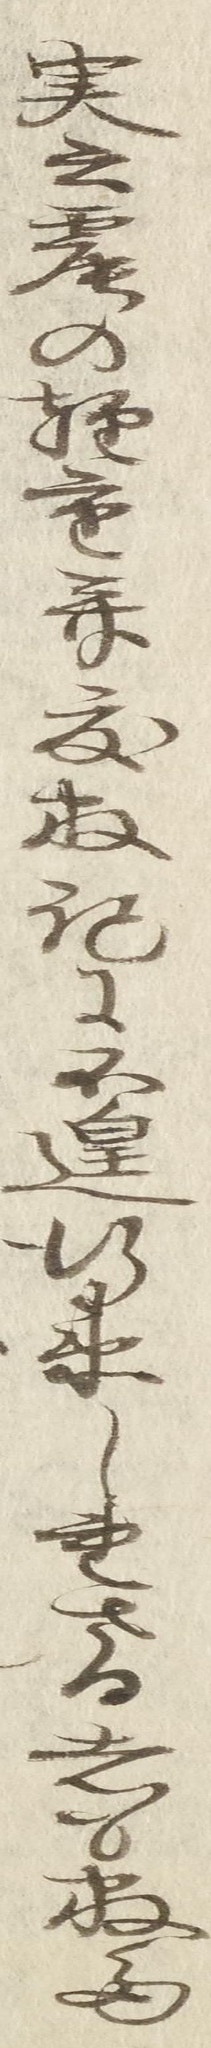実云震の軽重幷度数記に不遑行衛しれさる者も数多
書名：地震記　上
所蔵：東京大学地震研究所図書室 Earthquake Research Institute Library, The University of Tokyo, JAPAN
